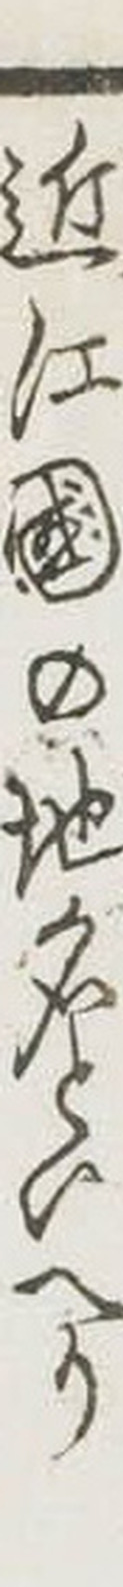近江国の地名といへり
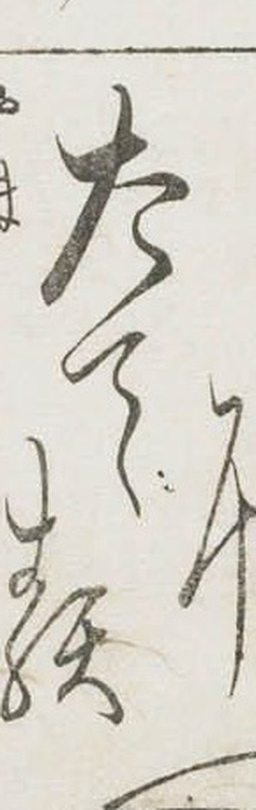たてる
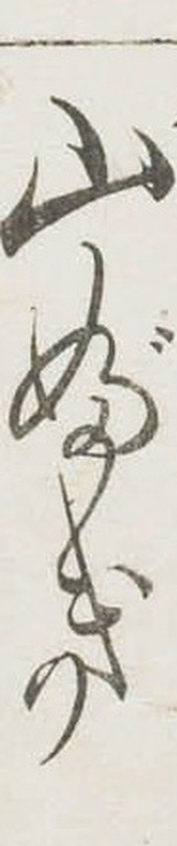山ぶき
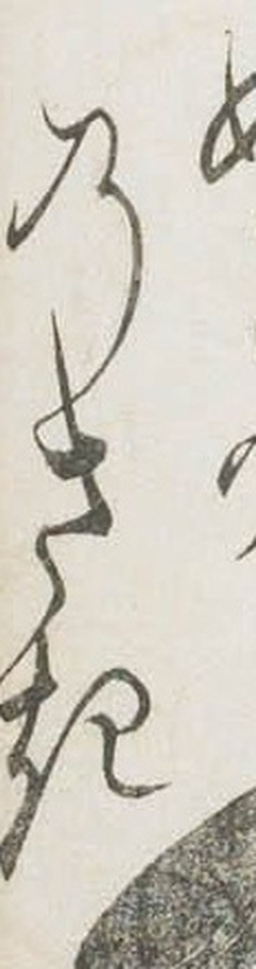のさき
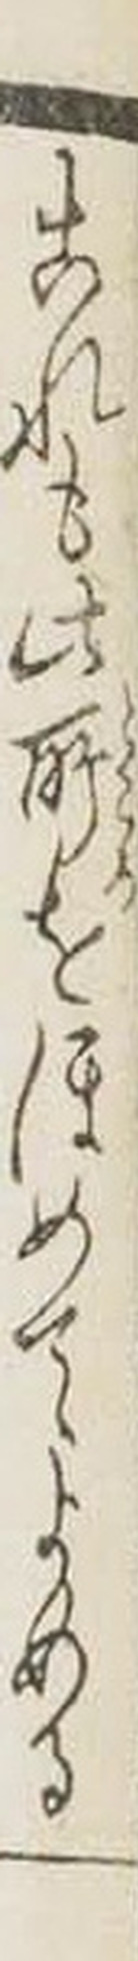これも此所をほめてよめる
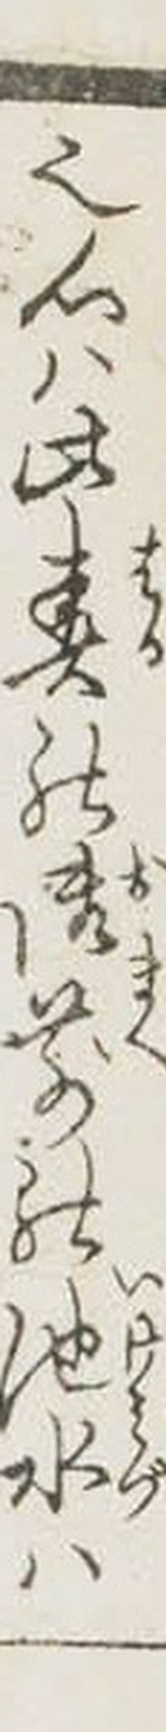也心は此春の御前の池水は
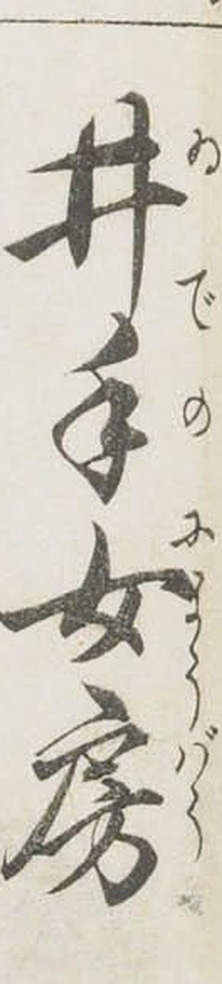井手女房
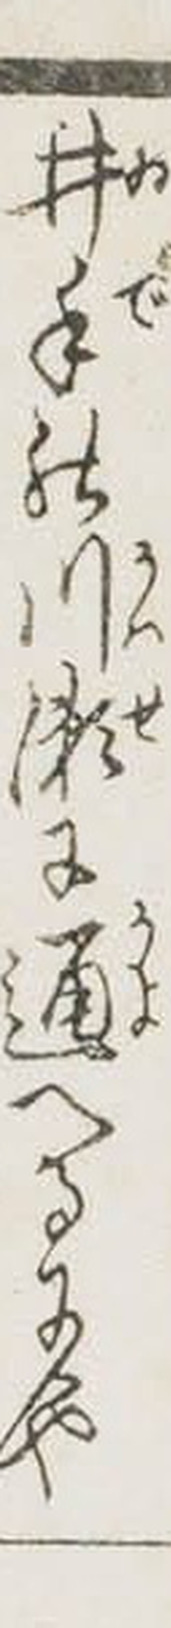井手の川瀬に通へるにや
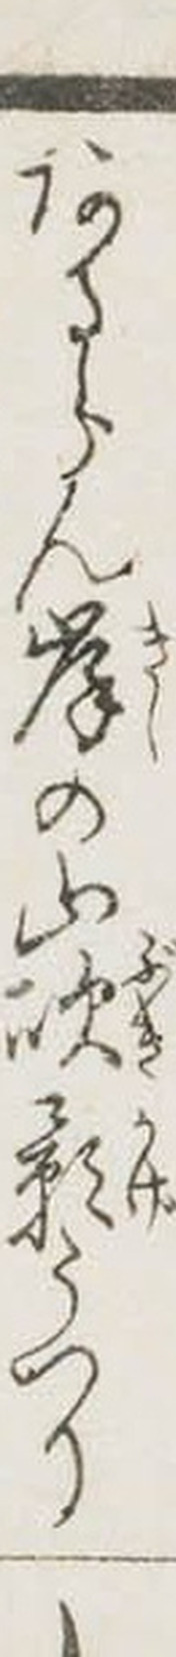あるらん岸の山吹影うつり
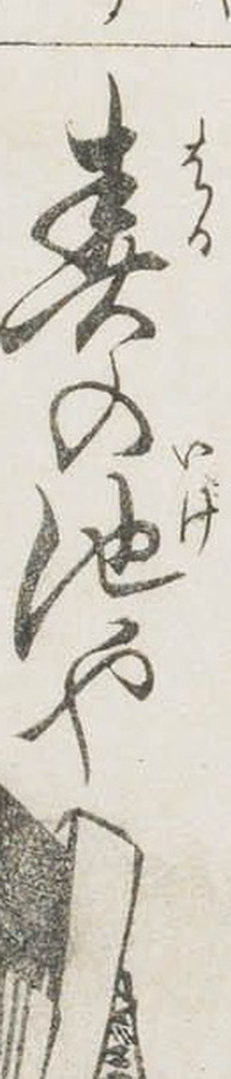春の池や
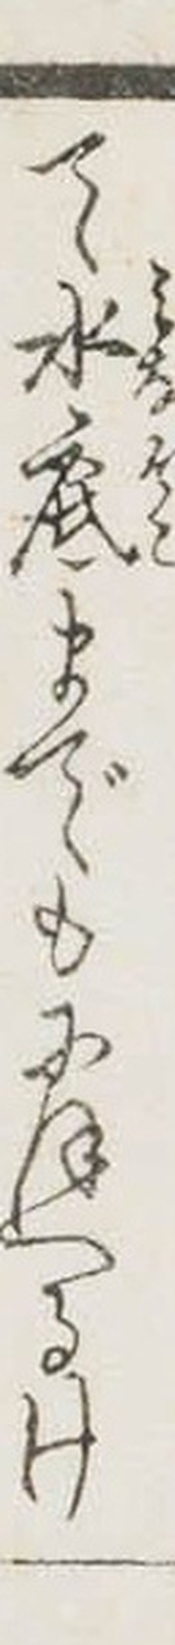て水底までもにほへるけ
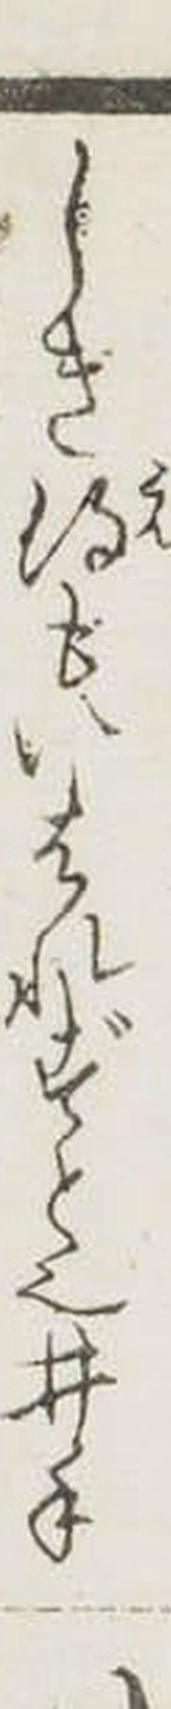しき得もいはれずと也井手
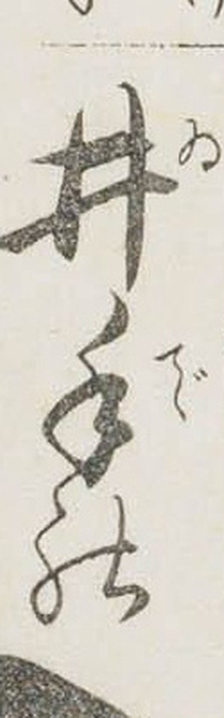井手の
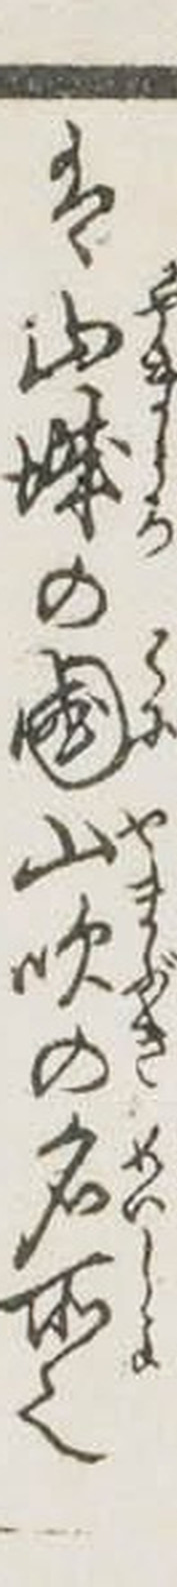は山城の国山吹の名所也
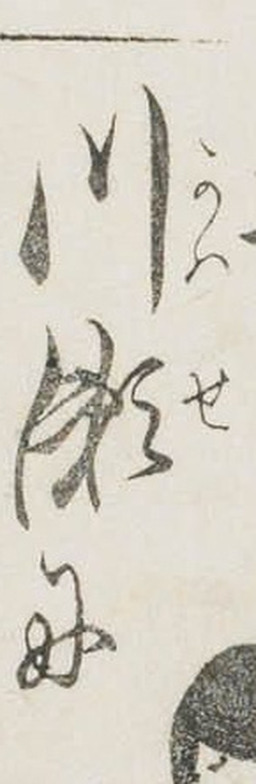川瀬に
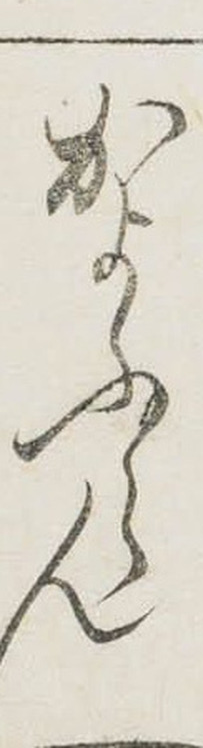かよふらん
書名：源氏百人一首
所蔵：東京学芸大学教育コンテンツアーカイブ
